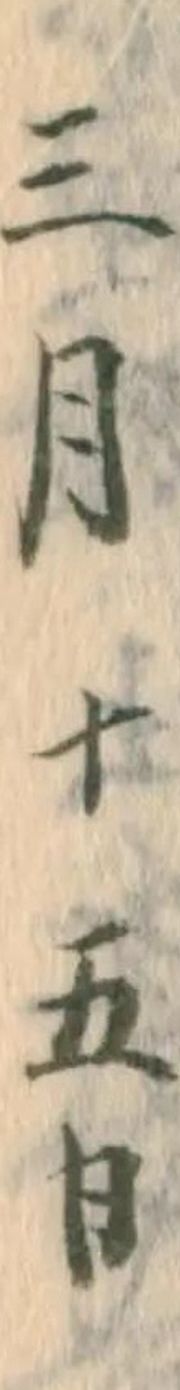三月十五日
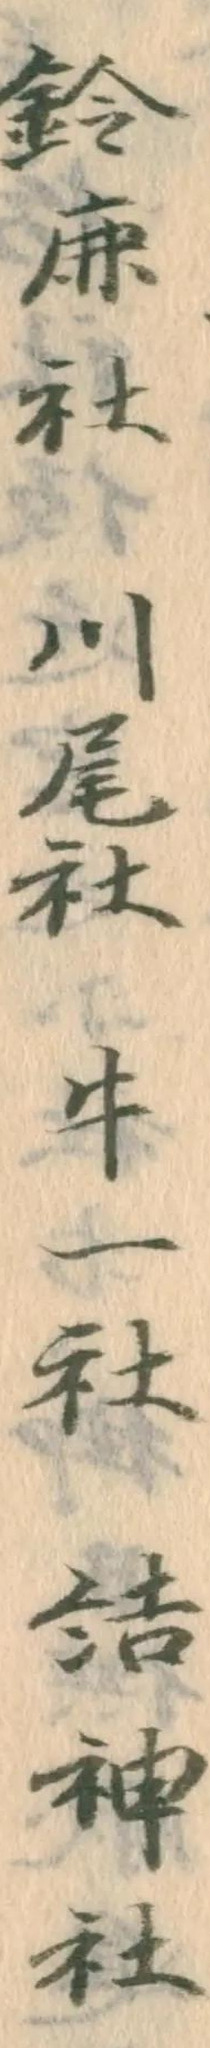鈴鹿社川尾社牛一社結神社
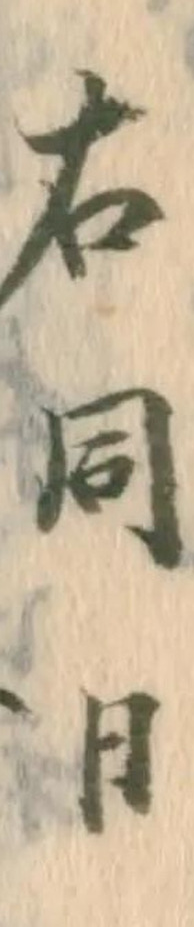右同日
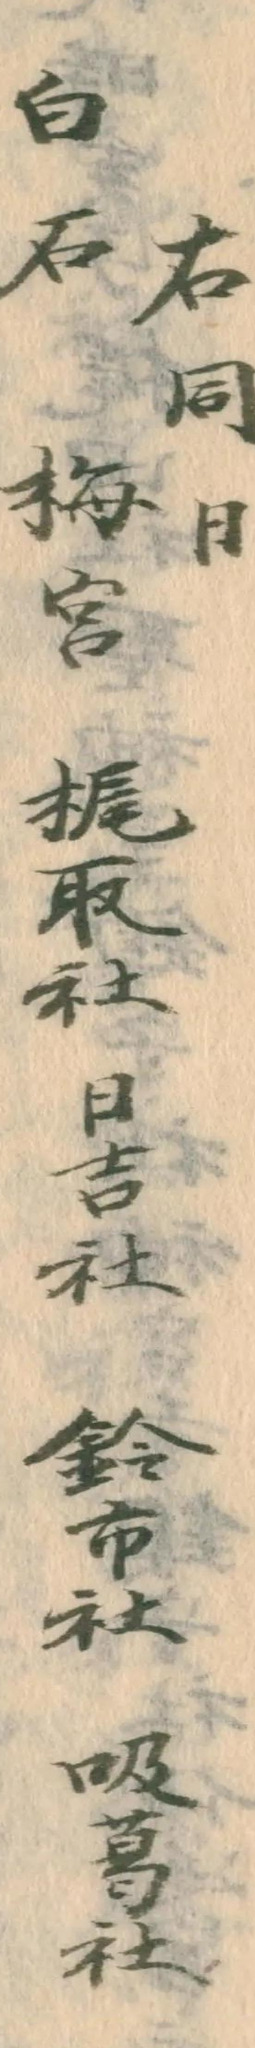白石梅宮梶取社日吉社鈴市社吸葛社
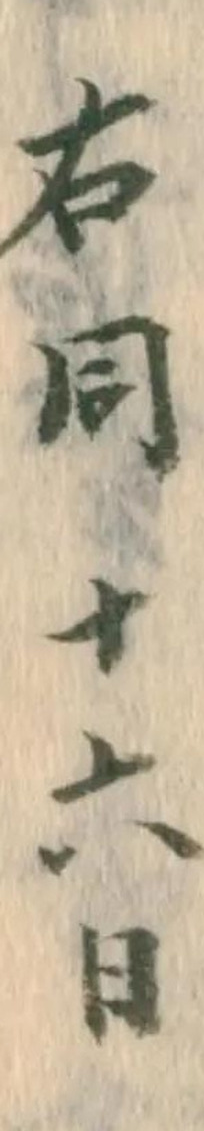右同十六日
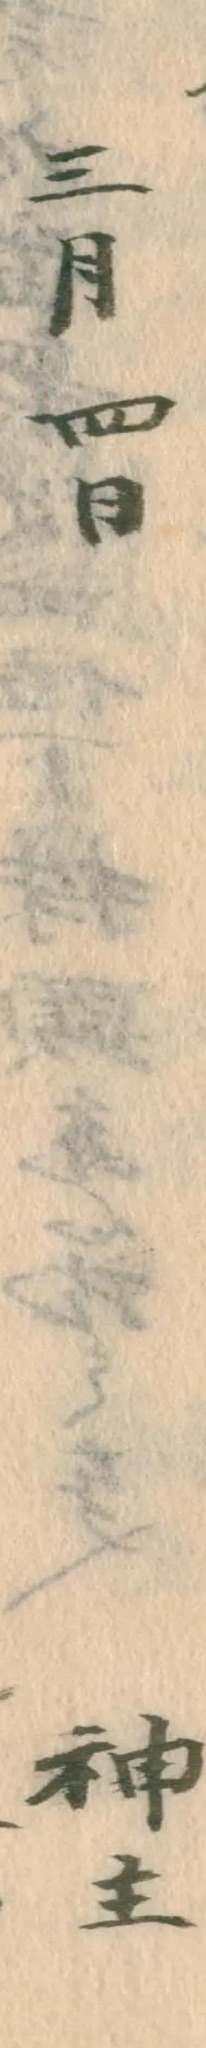三月四日神主
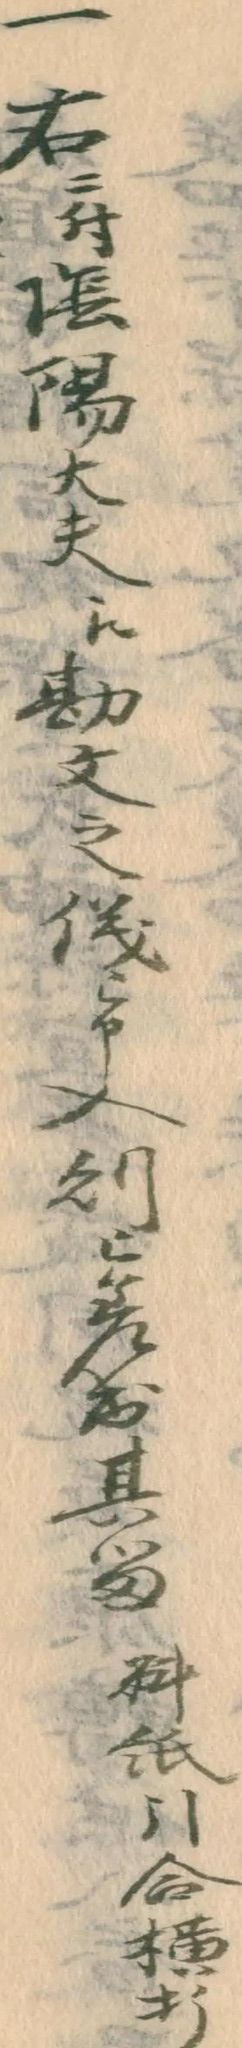一右ニ付陰陽大夫江勘文之儀被申入則被差出其留料紙引合横折
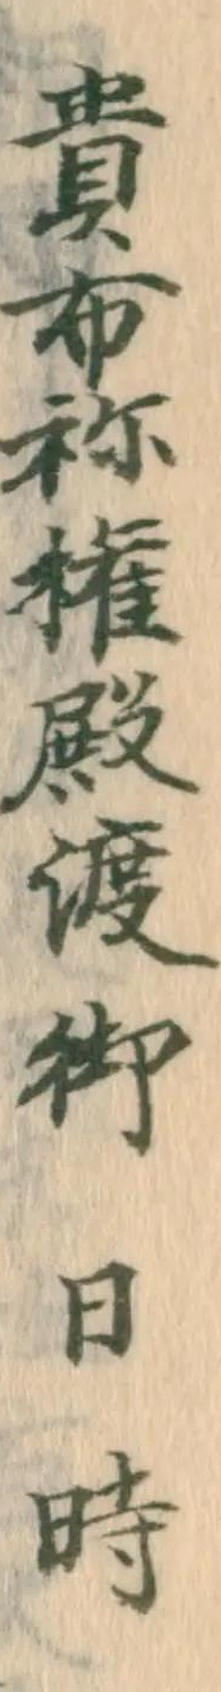貴布祢権殿渡御日時
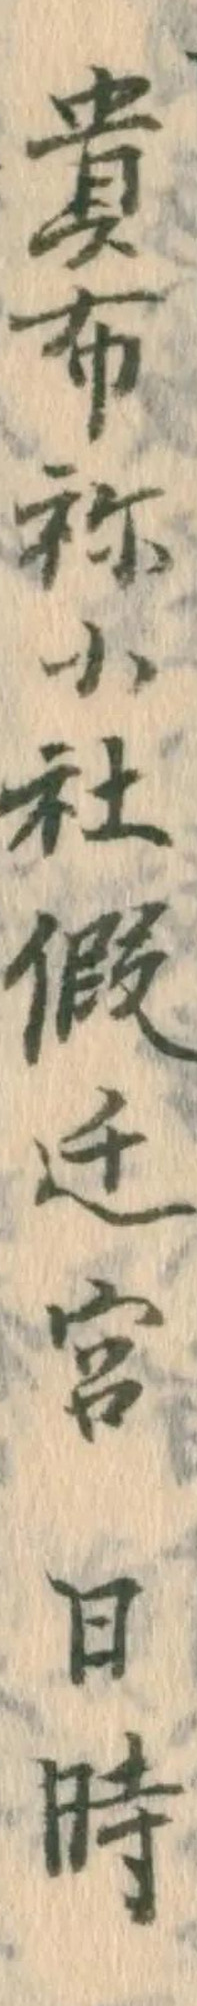貴布祢小社仮迁宮日時
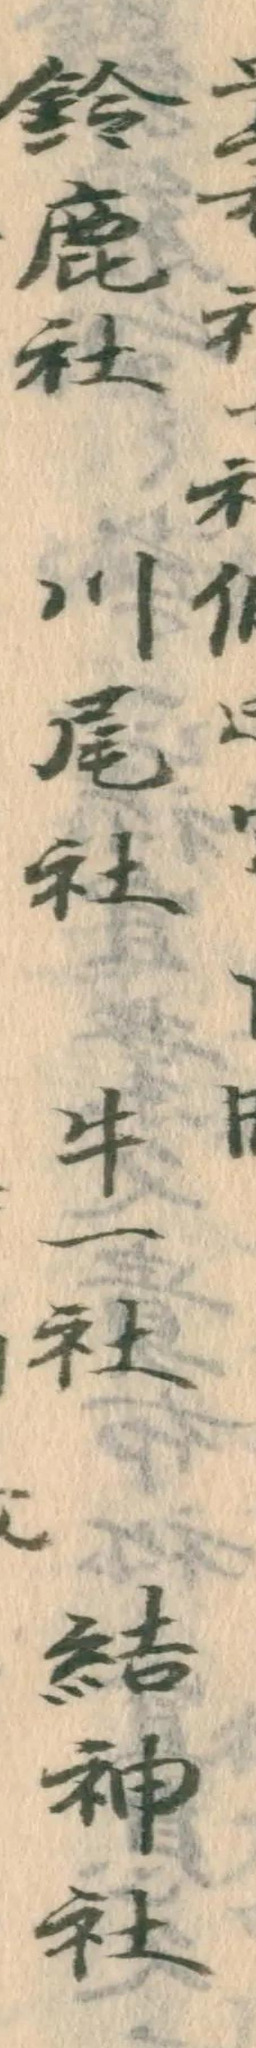鈴鹿社川尾社牛一社結神社
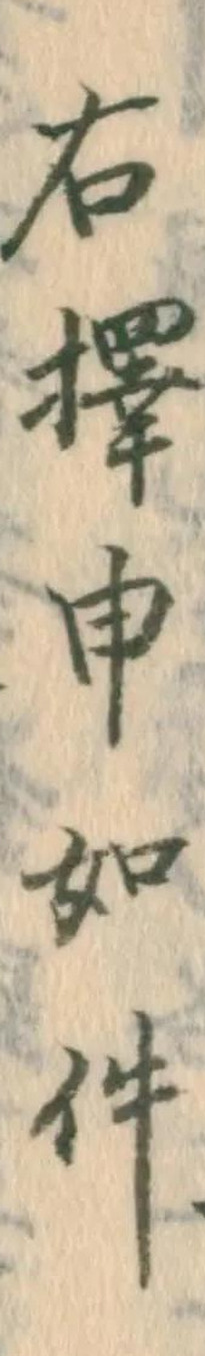右択申如件
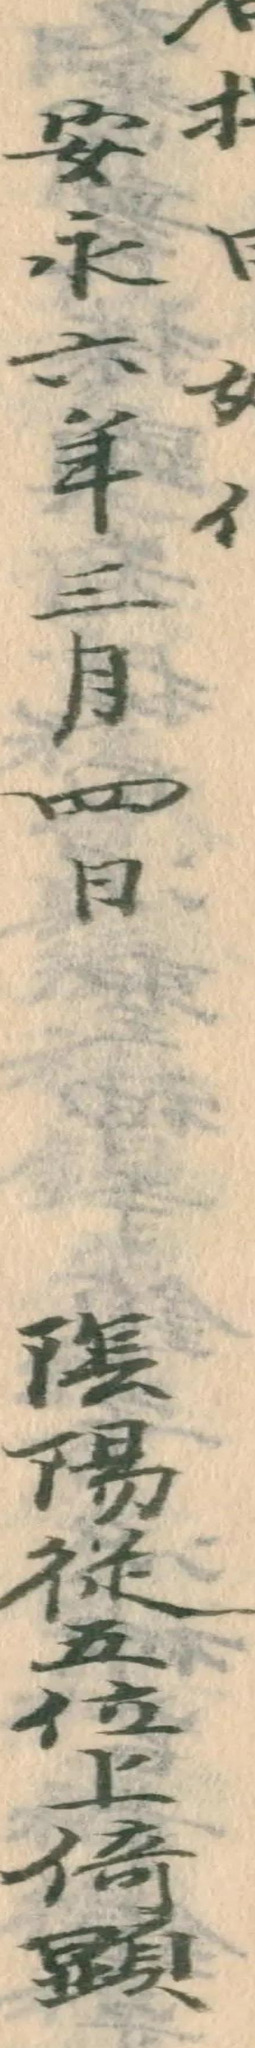安永六年三月四日陰陽従五位上倚顕
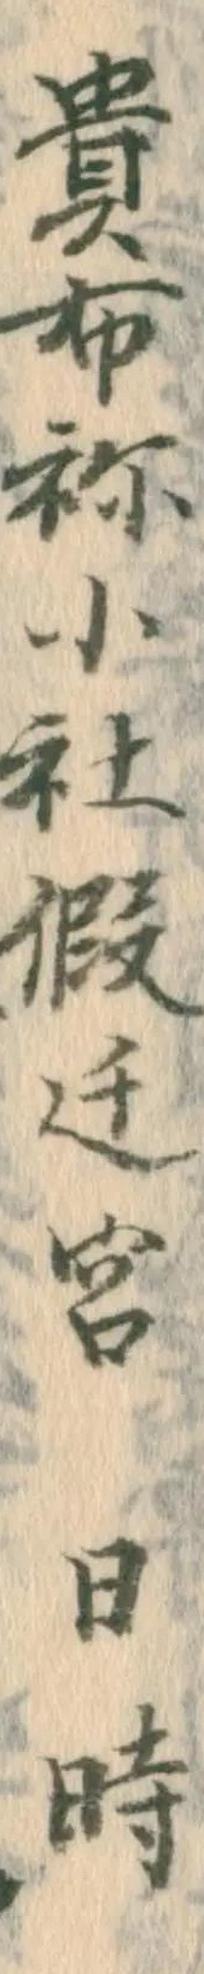貴布祢小社仮迁宮日時
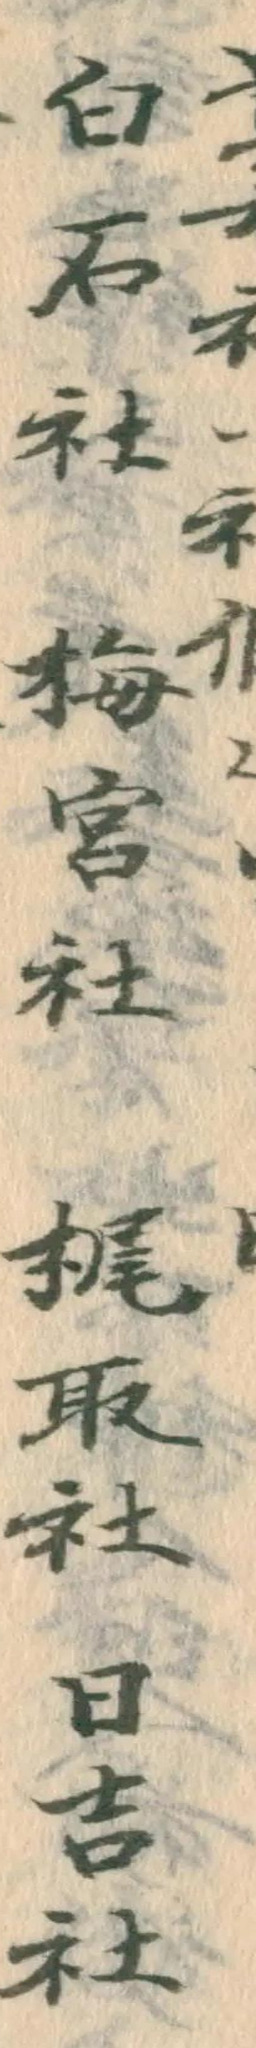白石社梅宮社梶取社日吉社
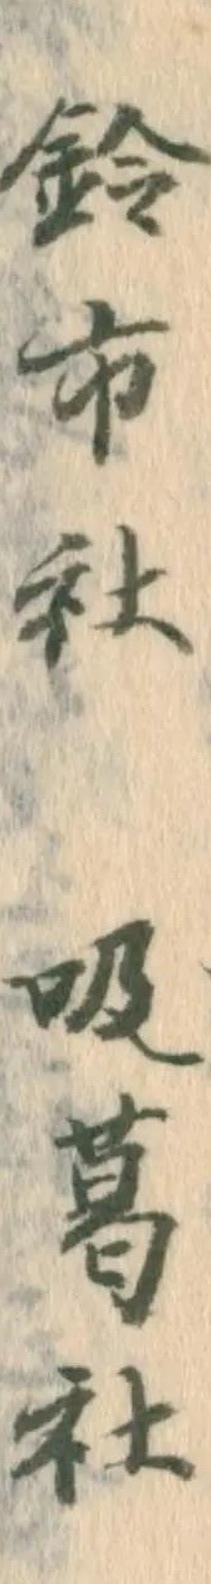鈴市社吸葛社
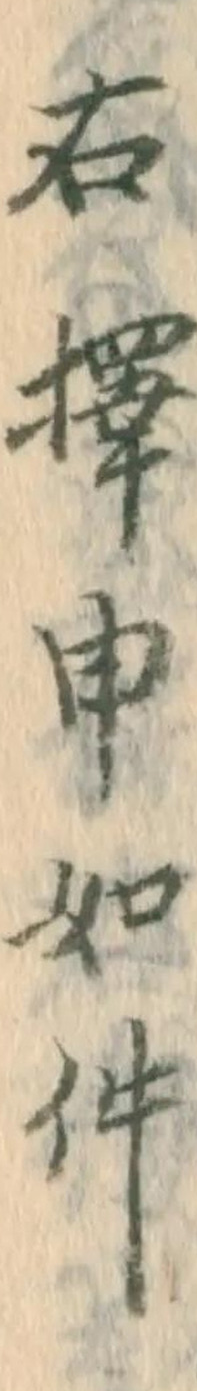右択申如件
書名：賀茂社記録. 第17冊
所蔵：国立国会図書館 National Diet Library, JAPAN
